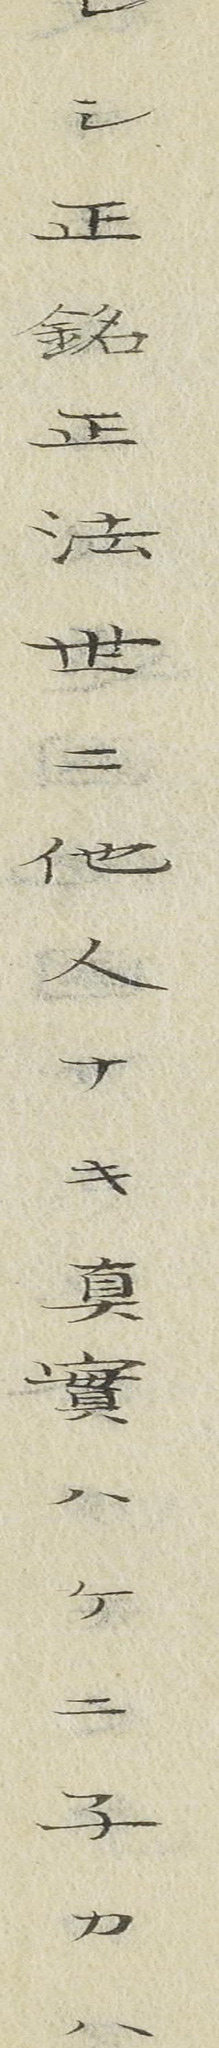レシ正銘正法世ニ他人ナキ真実ハケニ子カハ
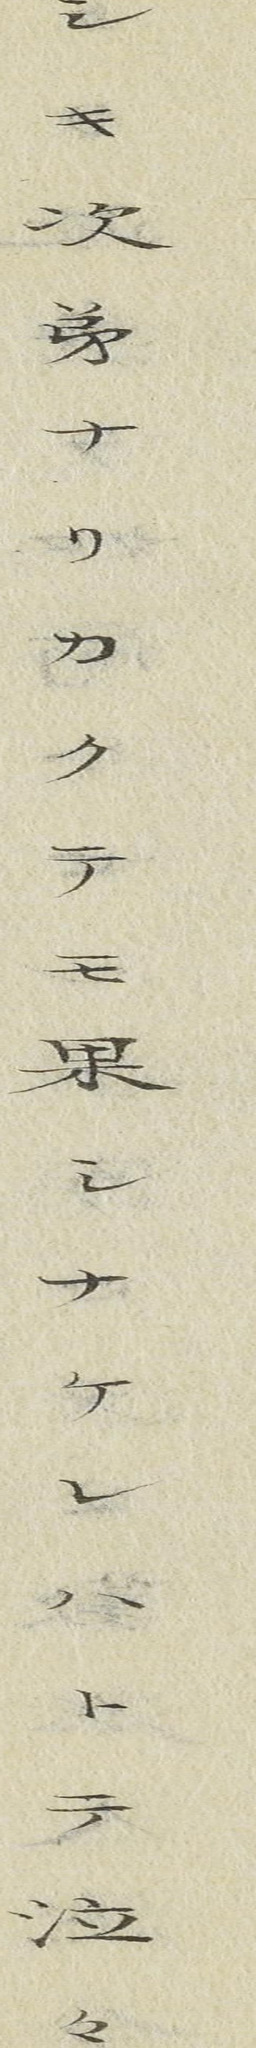シキ次第ナリカクテモ果シナケレハトテ涙々
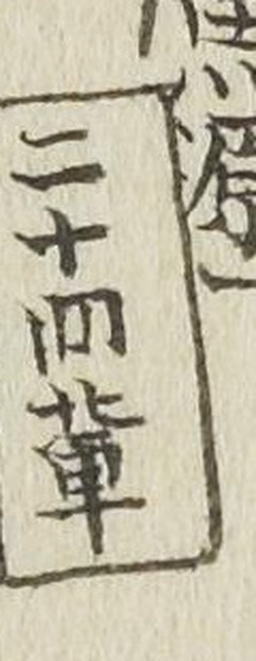二十四軰
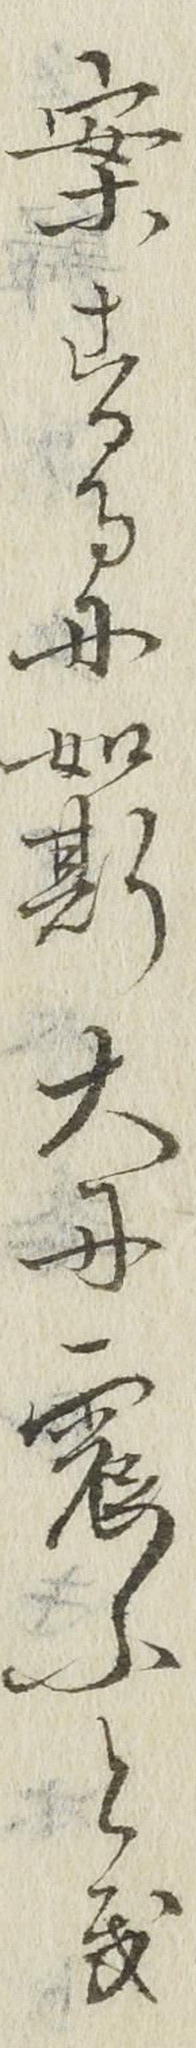案する舟如斯大舟震ふとも
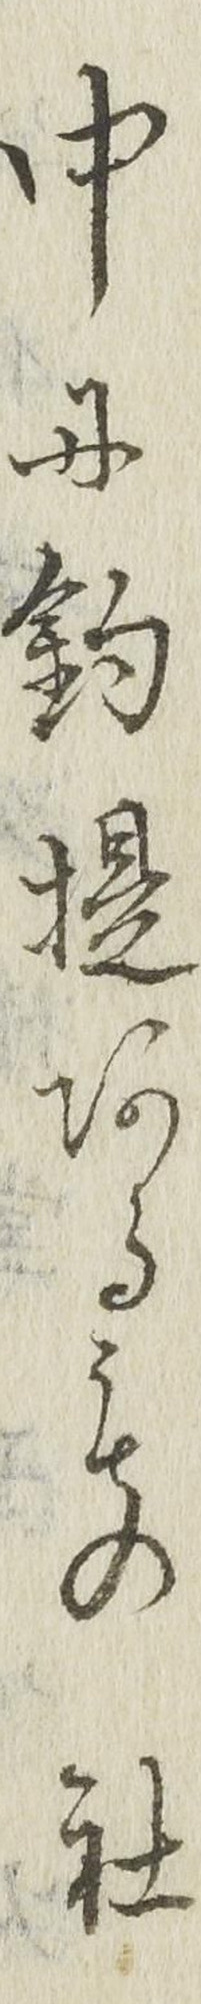中舟釣提あるその社
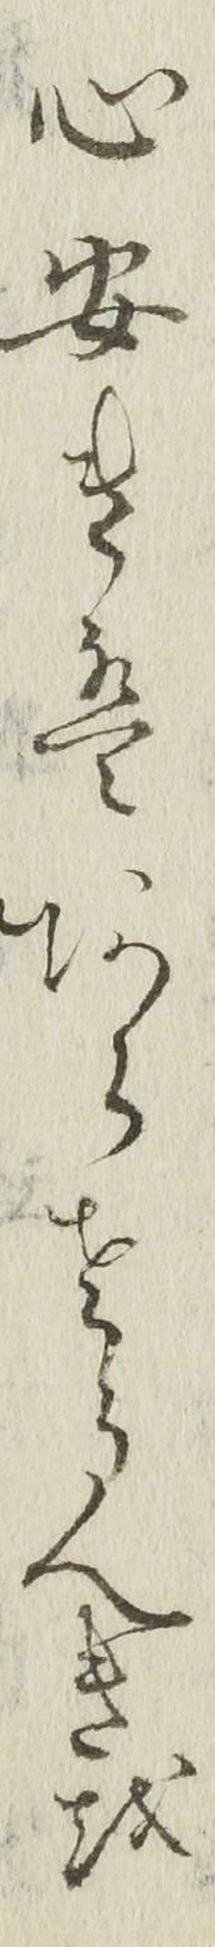心安きそあらけらんきを
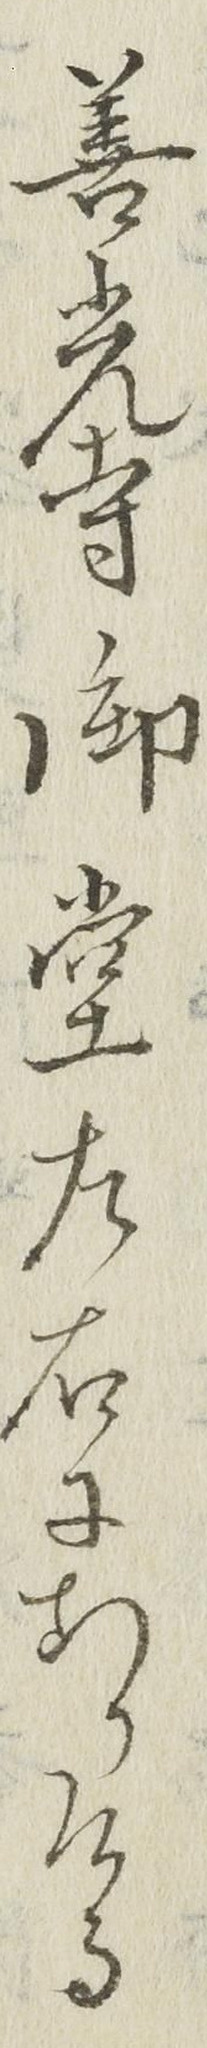善光寺御堂左右にありける
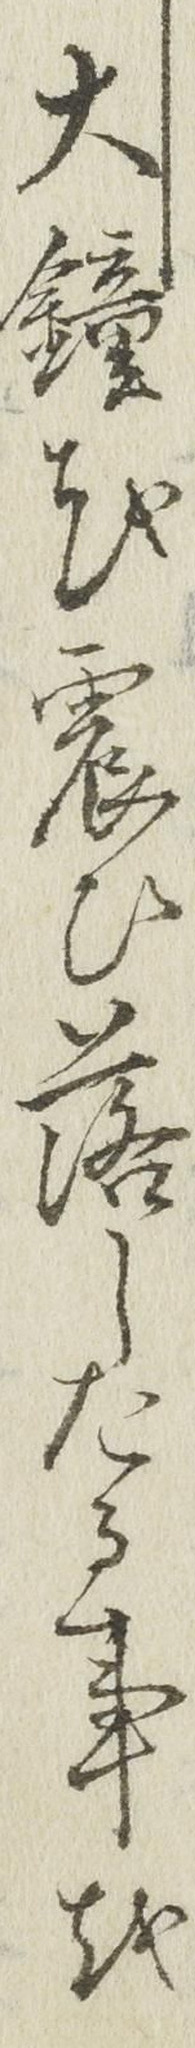大鐘を震ひ落したる事を
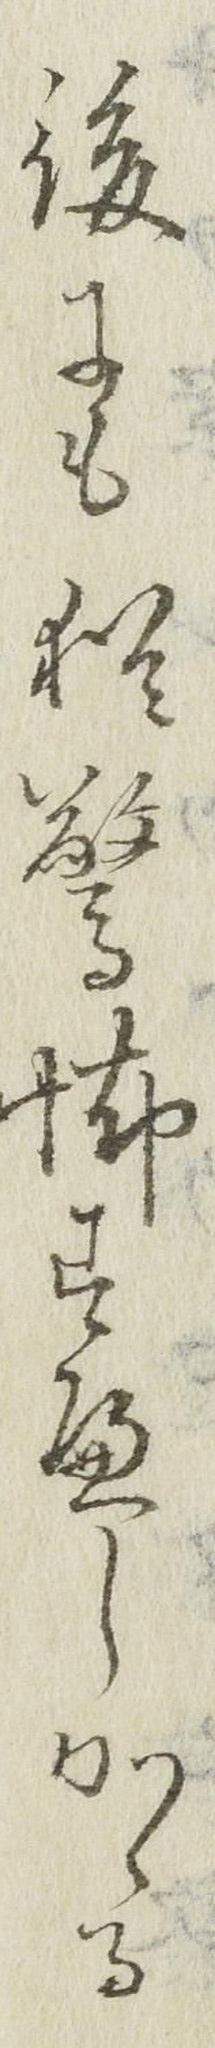後にも猶驚怖すへしかゝる
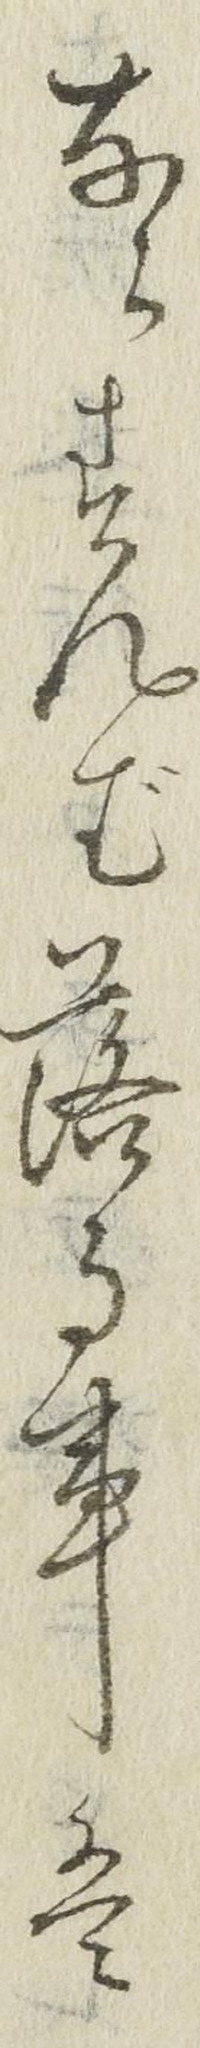ならすんば落る事そ
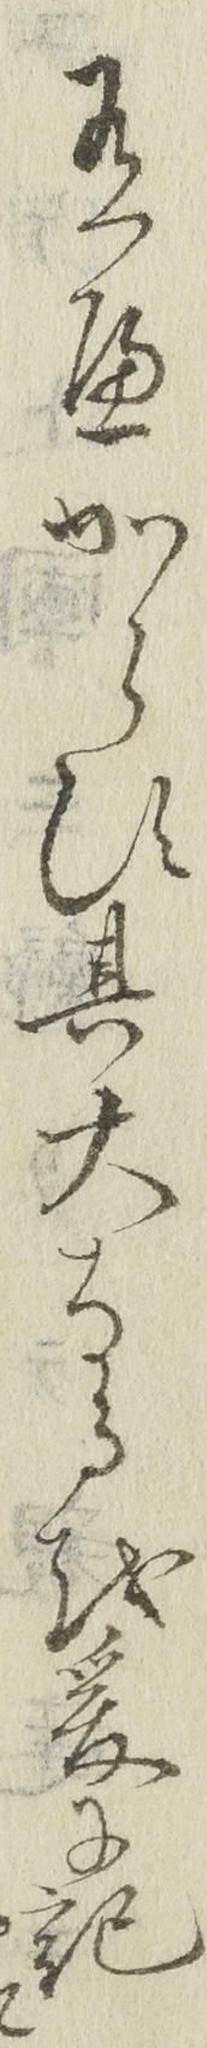在へからす大なるを爰に記す

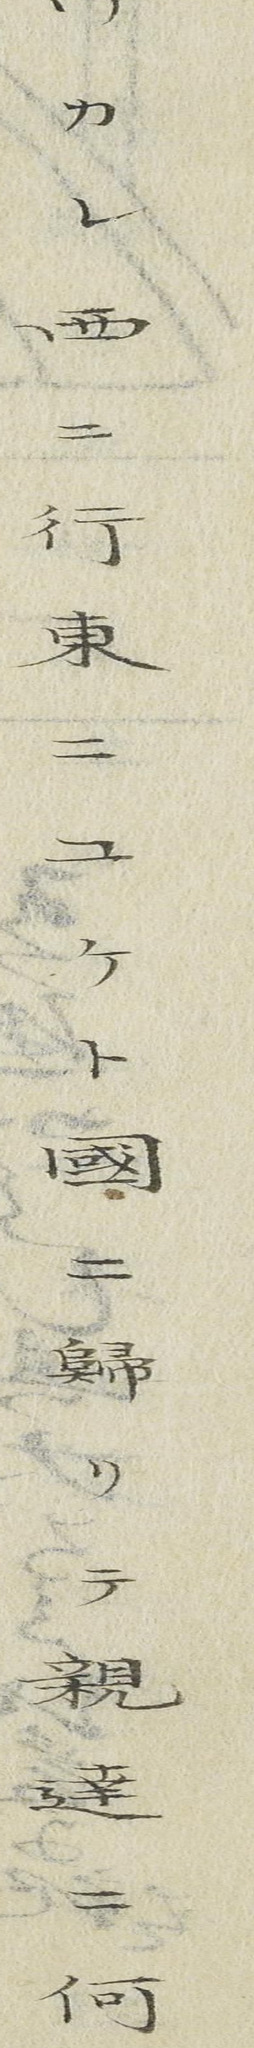ワカレ西ニ行東ニユケト国ニ帰リテ親達ニ何
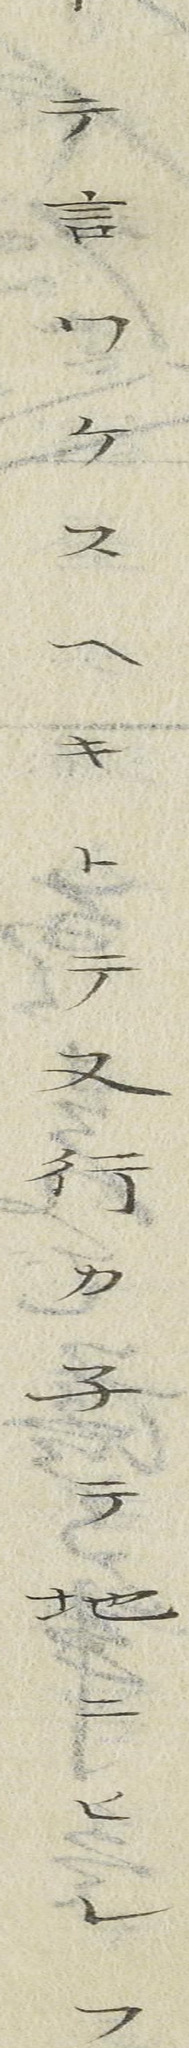トテ言ワケスヘキトテ又行カ子テ地ニヒレフ
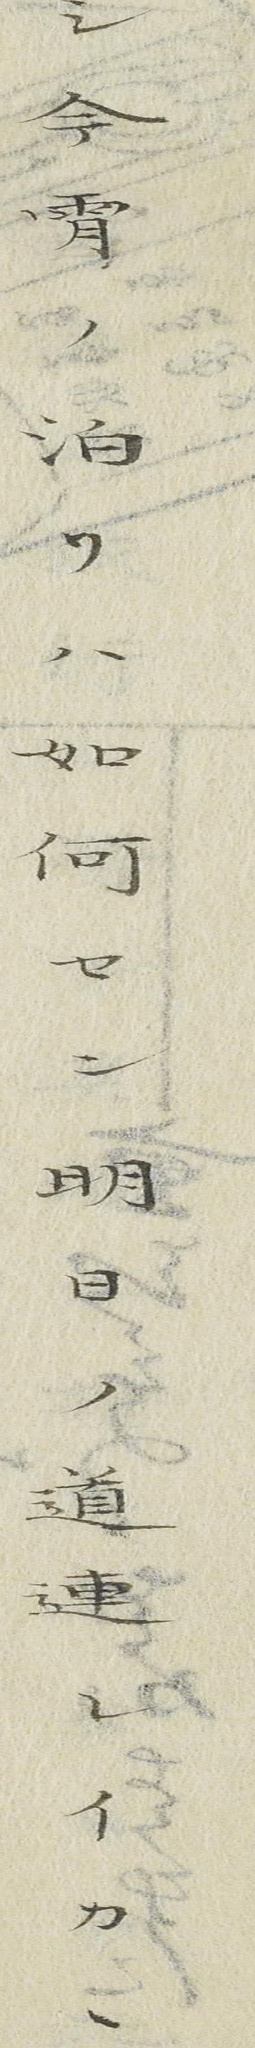シ今宵ノ泊リハ如何セン明日ノ道連レイカヽ
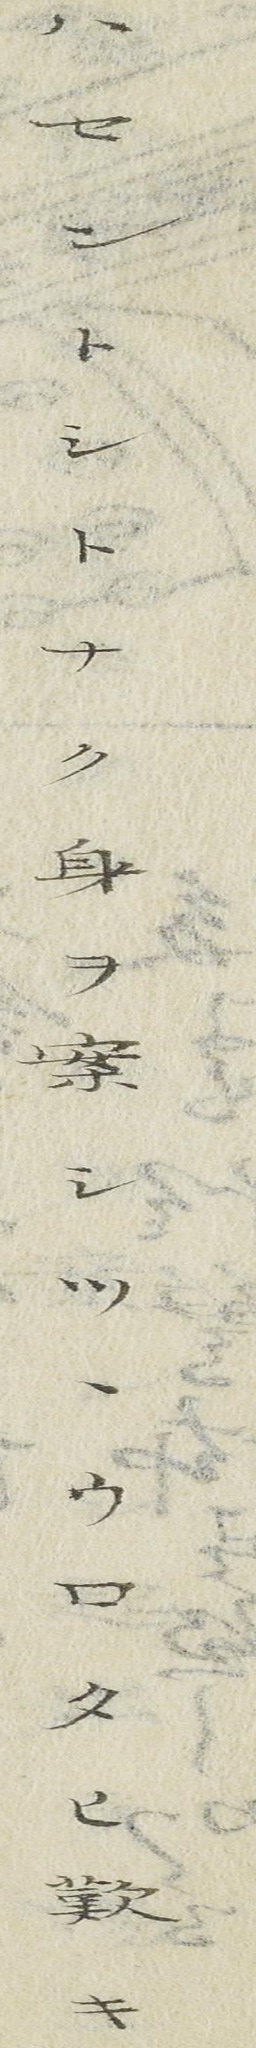ハセントシトナク身ヲ案シツヽウロタヒ歎キ
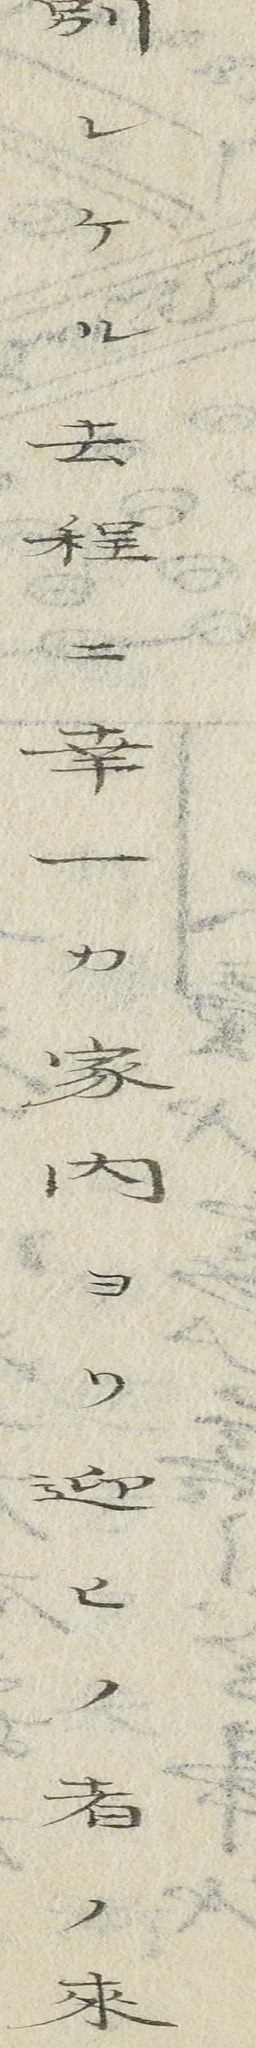別レケル去程ニ幸一カ家内ヨリ迎ヒノ者ノ来
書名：地災撮要　地震之部　巻ノ二
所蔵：東京大学地震研究所図書室 Earthquake Research Institute Library, The University of Tokyo, JAPAN
